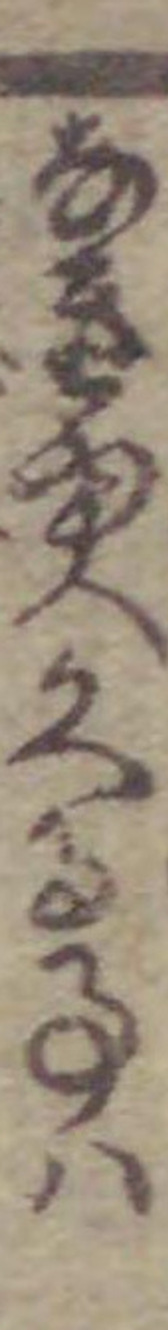なきゆへかへる事は
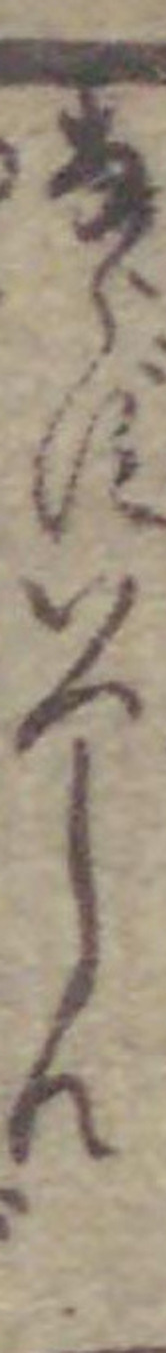ならずいつしん
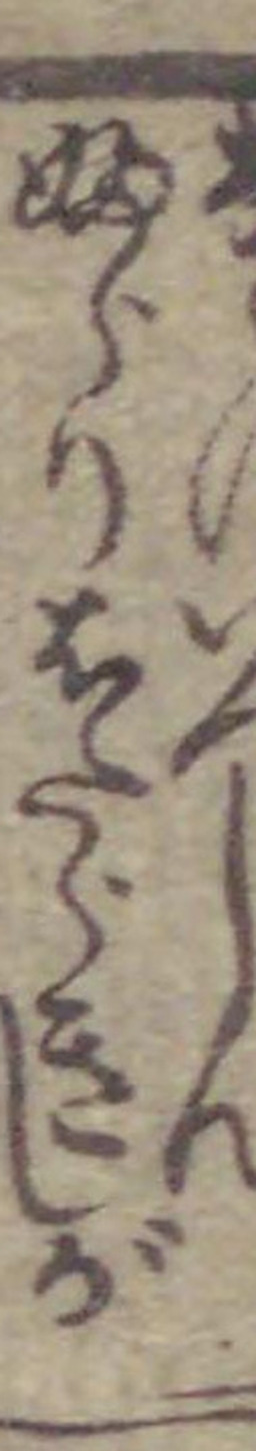ふらりはたらきしが
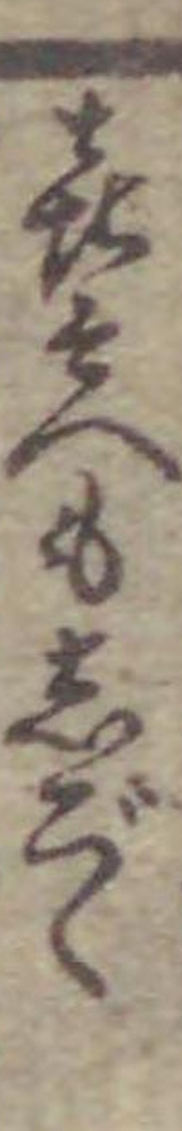喜兵へもしごく
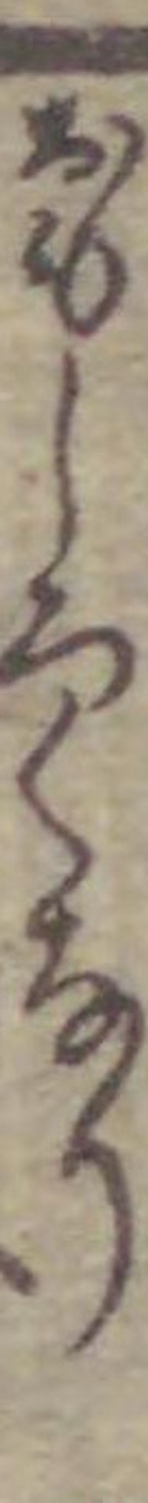おもしろくなり
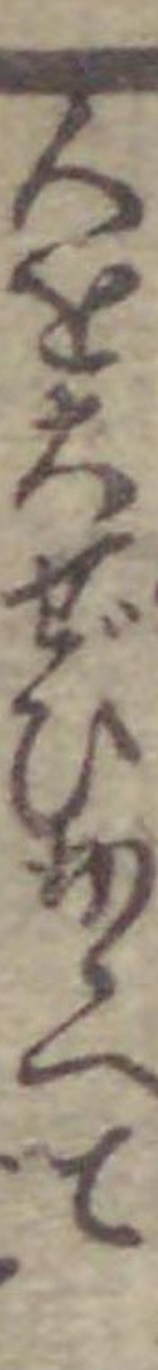人を大ぜひかゝへて
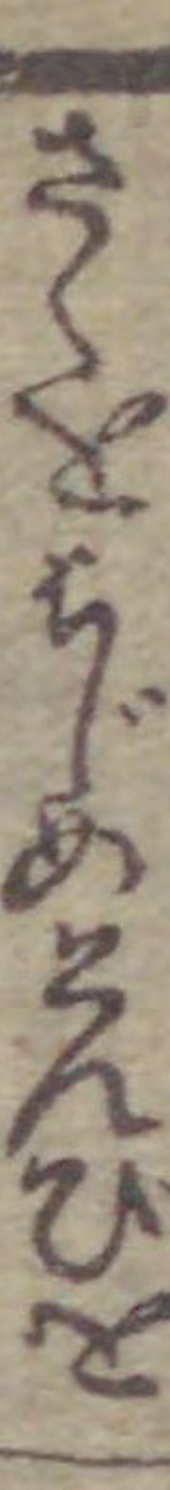さくをはじめとんびを
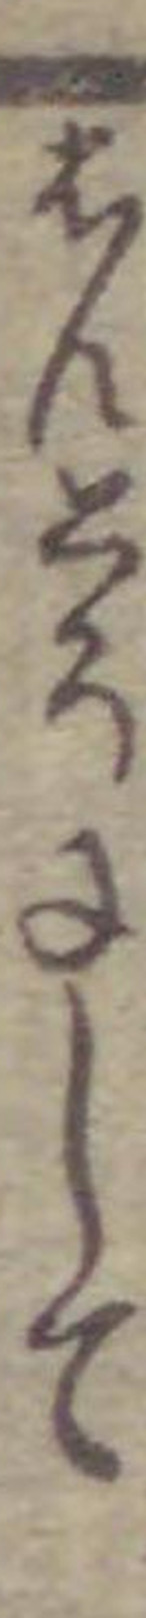はんとうにして
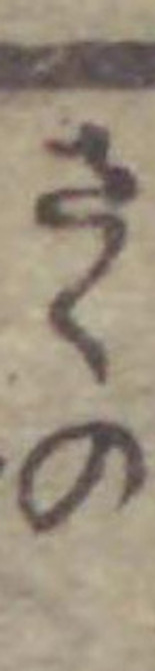さくの
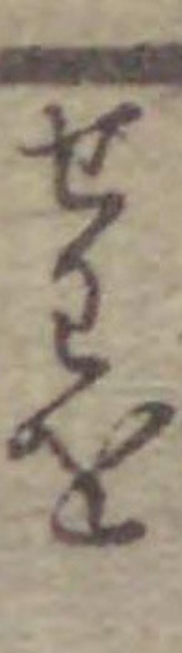せわを
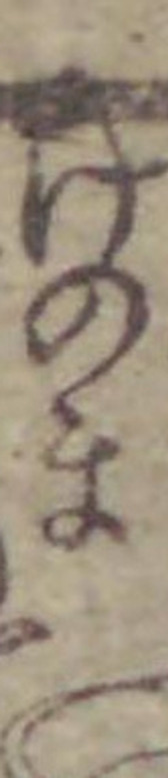けのま
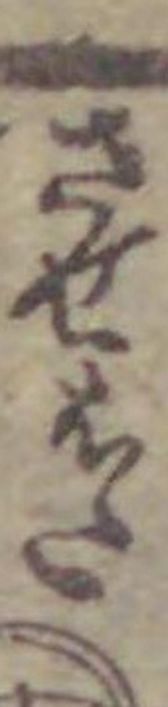させはた
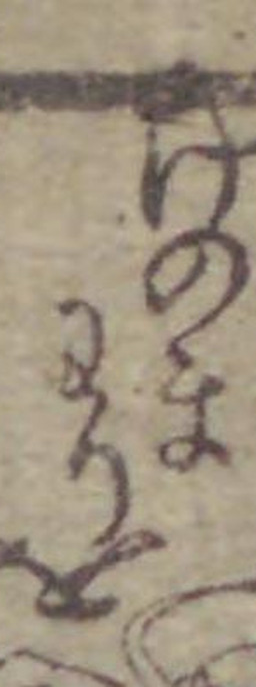わりを
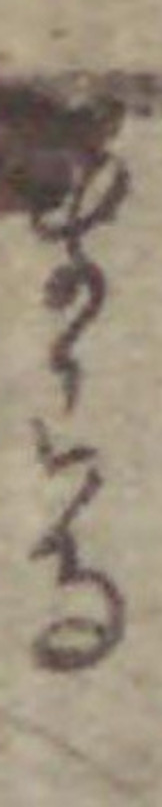まわる
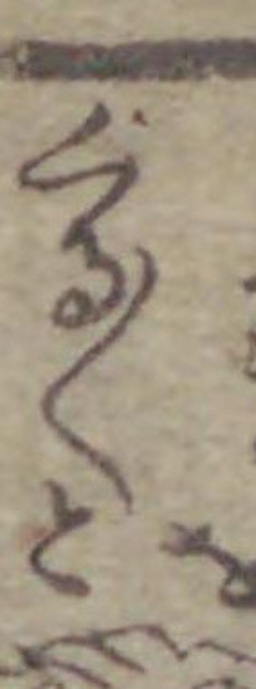くる〳〵と
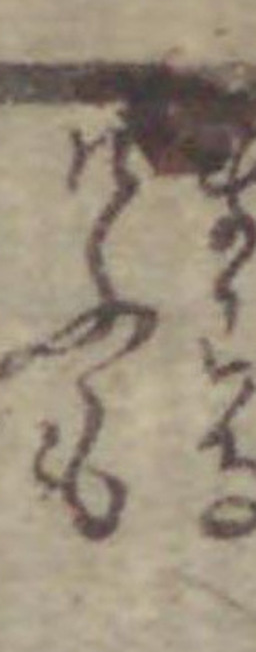けふも
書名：親父布子鳶握 3巻
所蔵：国立国会図書館 National Diet Library, JAPAN
